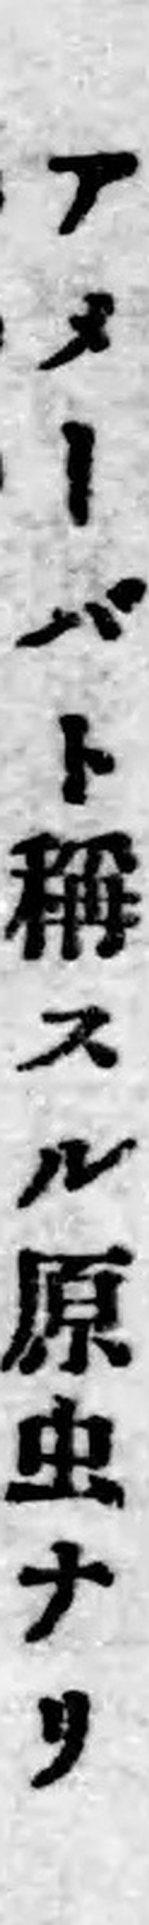アメーバト稱スル原虫ナリ
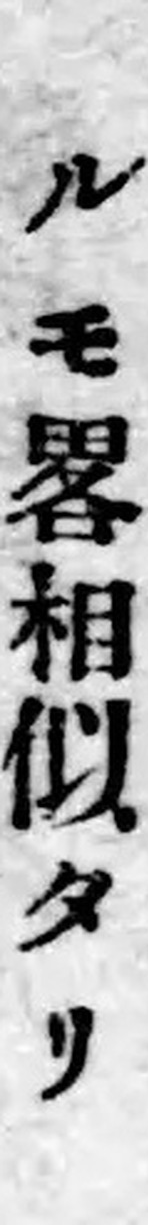ルモ畧相似タリ
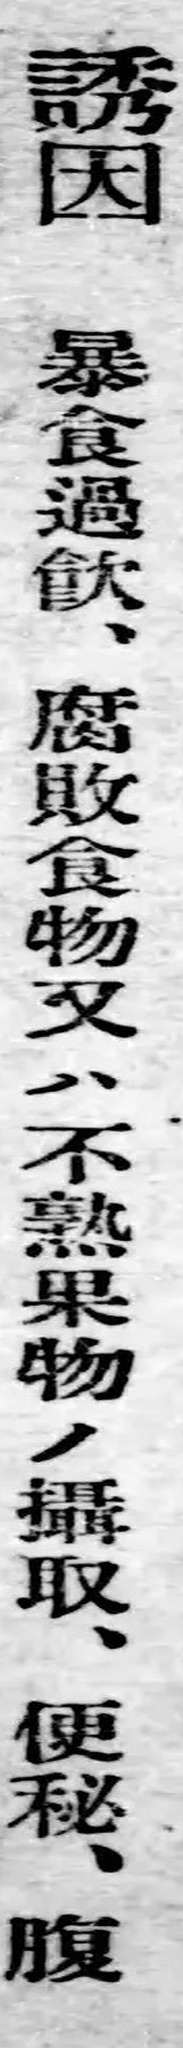誘因暴食過飮、腐敗食物又ハ不熟果物ノ攝取、便秘、腹
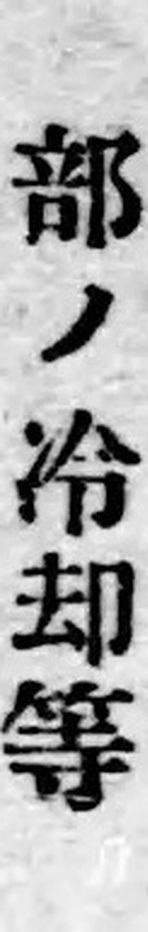部ノ冷却等
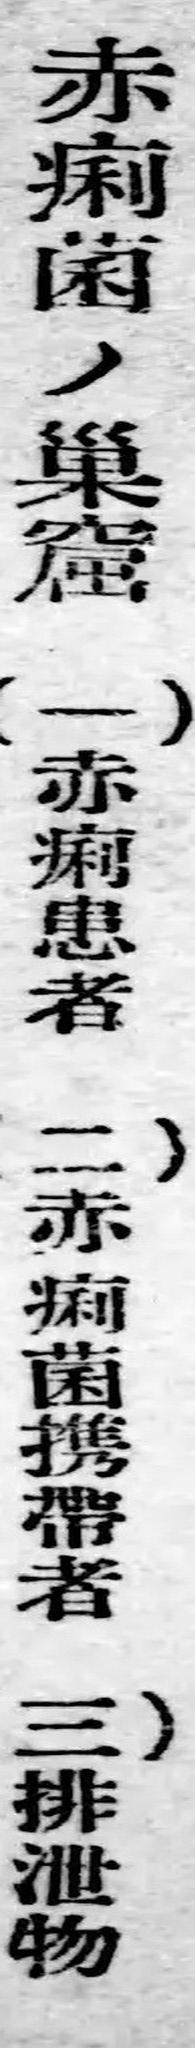赤痢菌ノ巢窟(一)赤痢患者(二)赤痢菌携帶者(三)排泄物
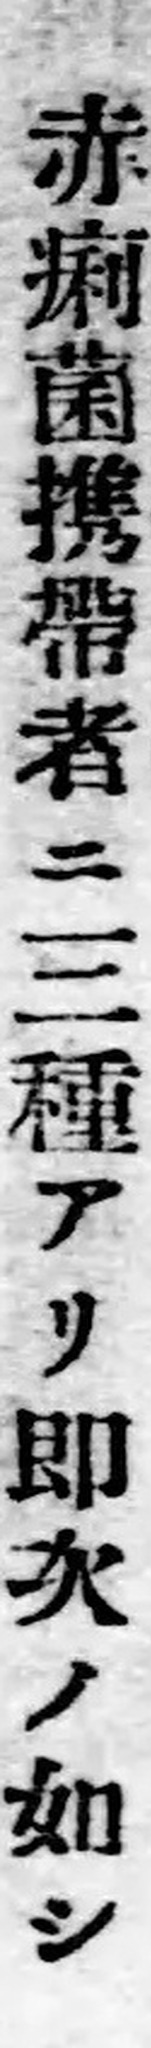赤痢菌携帯者ニ三種アリ即次ノ如シ
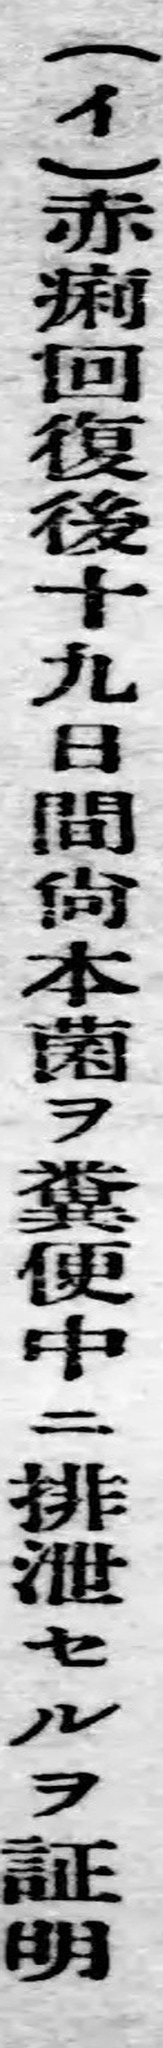(イ)赤痢回復後十九日間尚本菌ヲ糞便中ニ排泄セルヲ証明
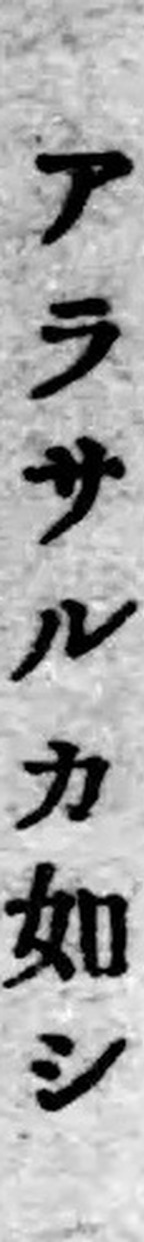アラサルカ如シ
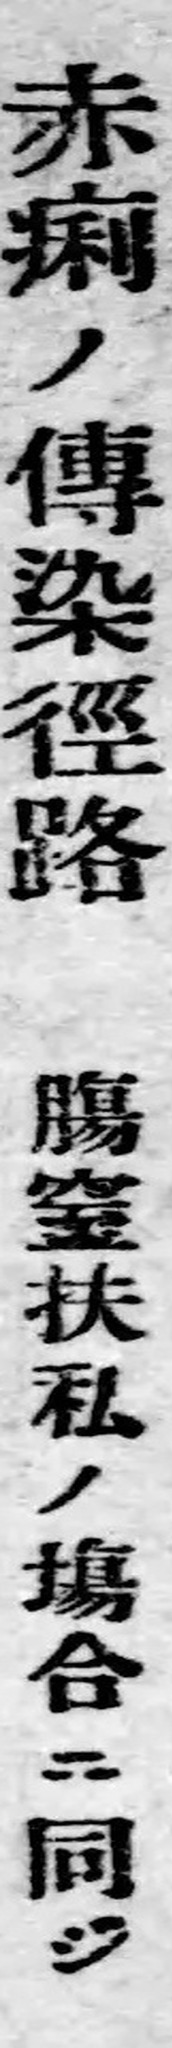赤痢ノ傅染經路膓窒扶私ノ場合ニ同ジ
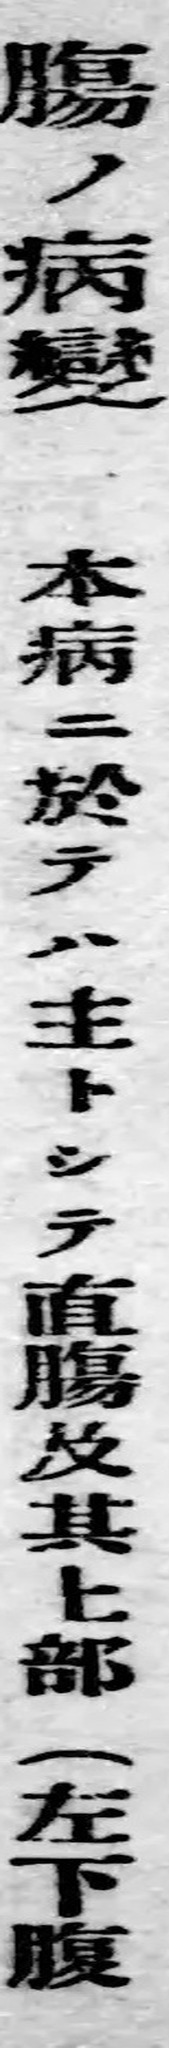膓ノ病變本病ニ於テハ主トシテ直膓及其上部(左下腹
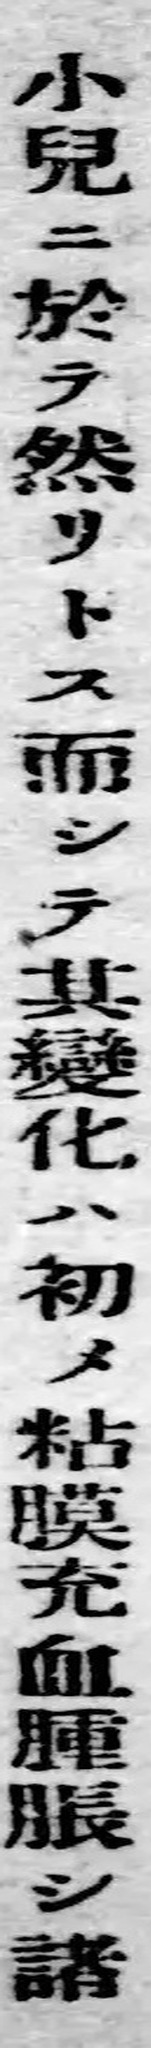小兒ニ於テ然リトス而シテ其變化ハ初メ粘膜充血腫脹シ諸
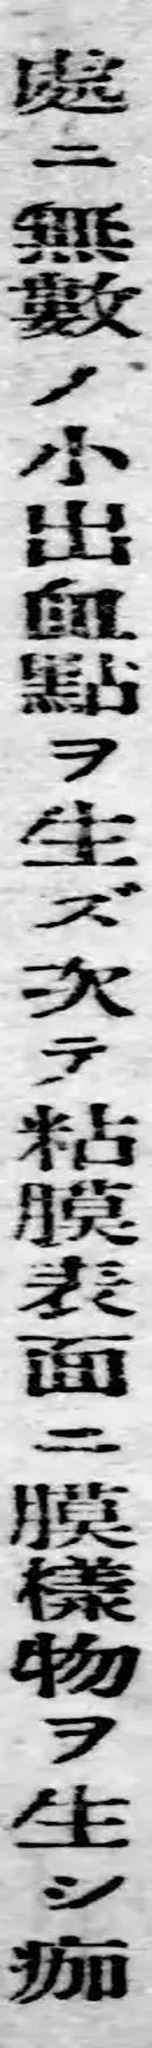處ニ無數ノ小出血點ヲ生ズ次テ粘膜表面ニ膜樣物ヲ生シ痂
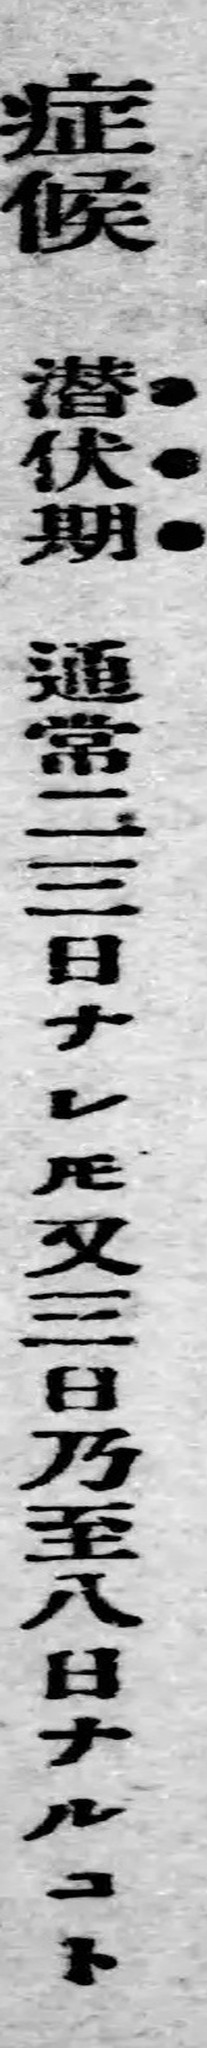症候潜伏期通常ニ三日ナレ𪜈又三日乃至八日ナルコト

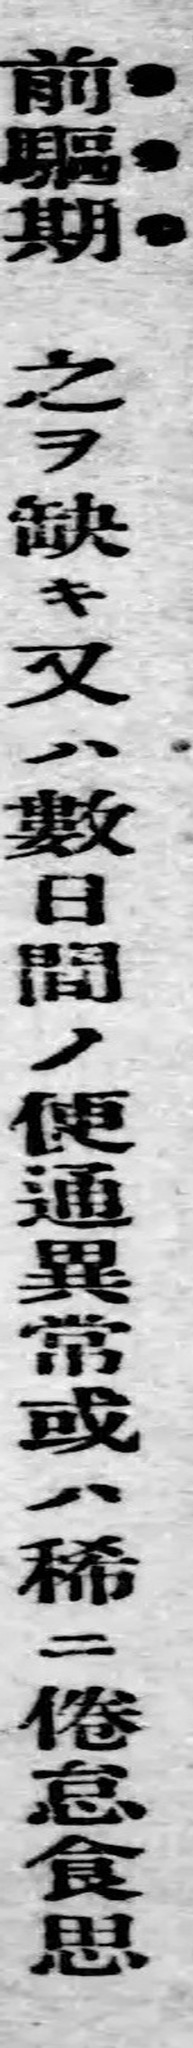前驅期之ヲ缺キ又ハ數日間ノ便通異常或ハ稀ニ倦怠食思
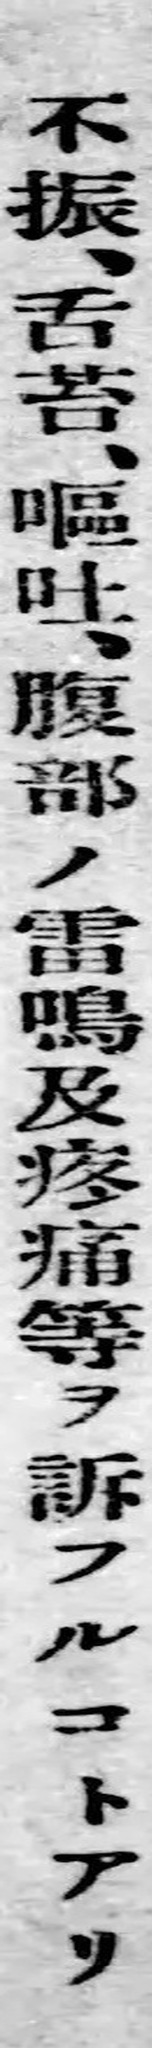不振、舌苔、嘔吐、腹部ノ雷鳴及疼痛等ヲ訴フルコトアリ
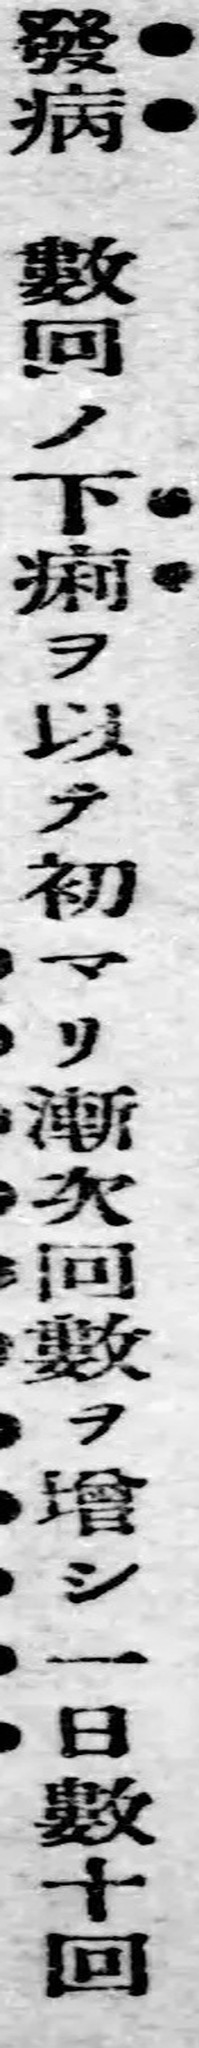發病數回ノ下痢ヲ以テ初マリ漸次回數ヲ增シ一日數十回
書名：袖珍防疫必携
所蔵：国立国会図書館 National Diet Library, JAPAN
